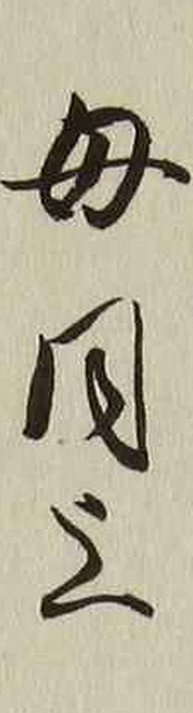母同上
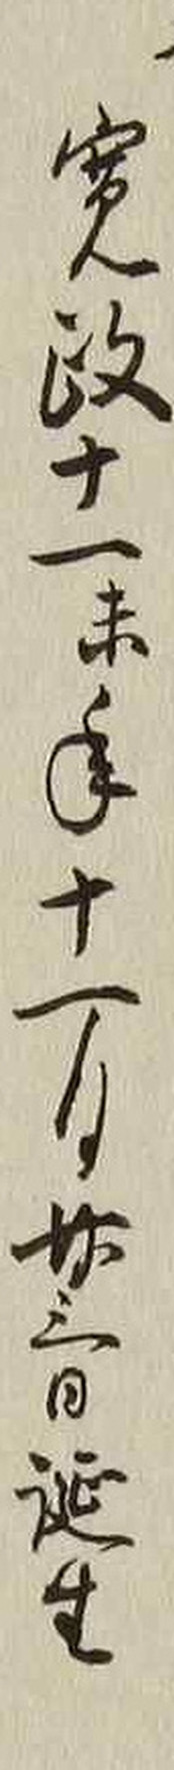寛政十一未年十一月廿三日誕生
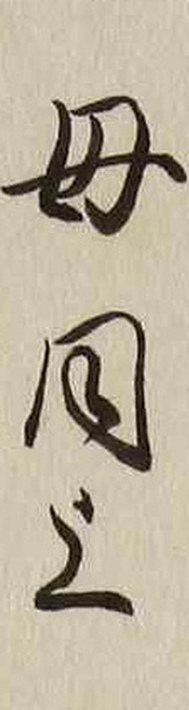母同上
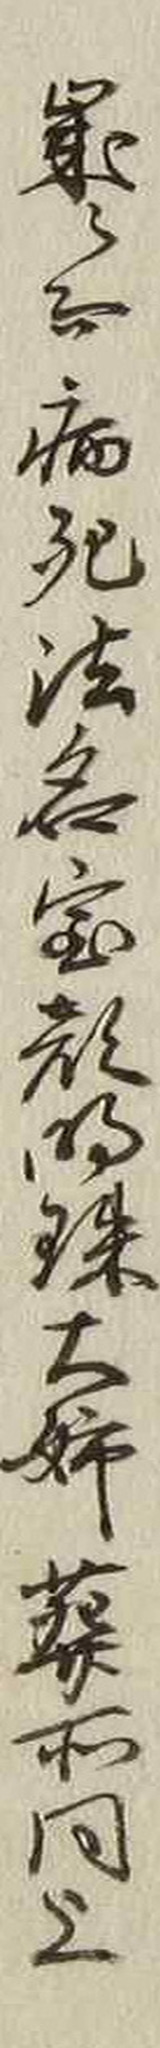歳ニ而病死法名宝顔明珠大姉葬所同上
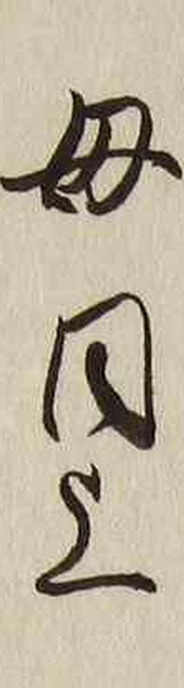母同上
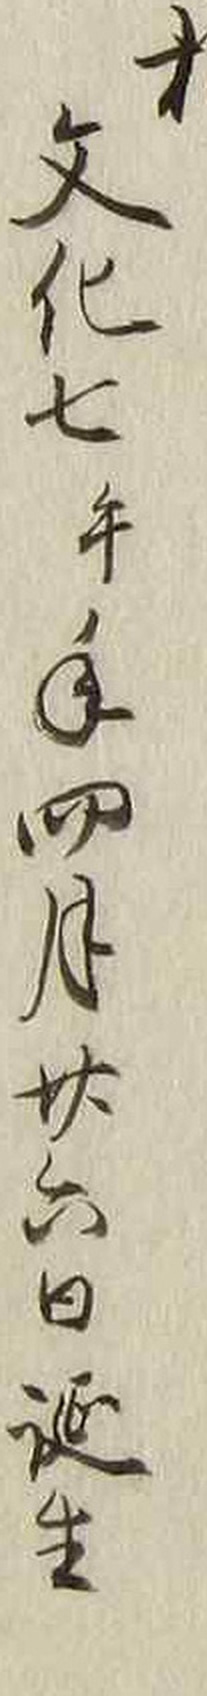文化七牛年四月廿六日誕生
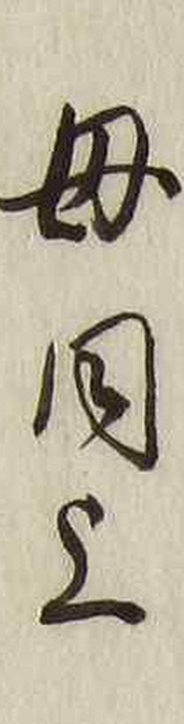母同上
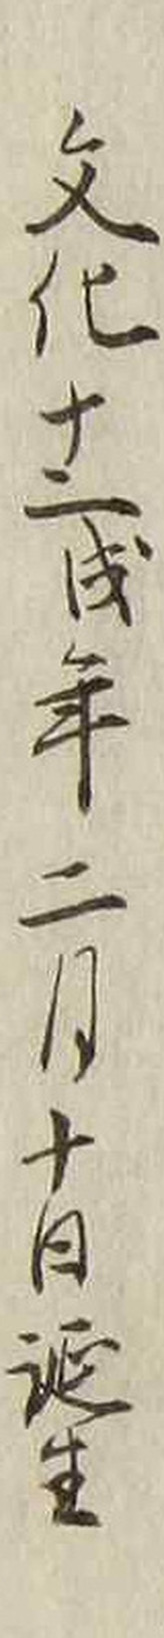文化十二戌年二月十日誕生
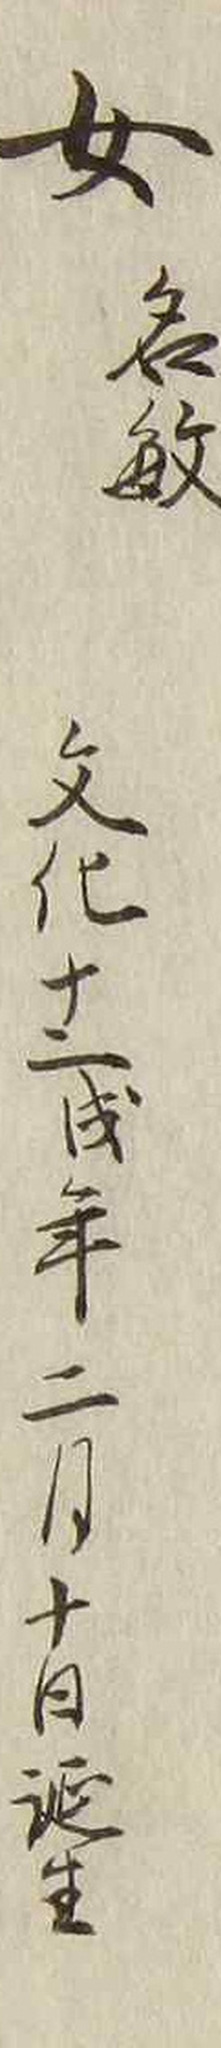文化十二戌年二月十日誕生

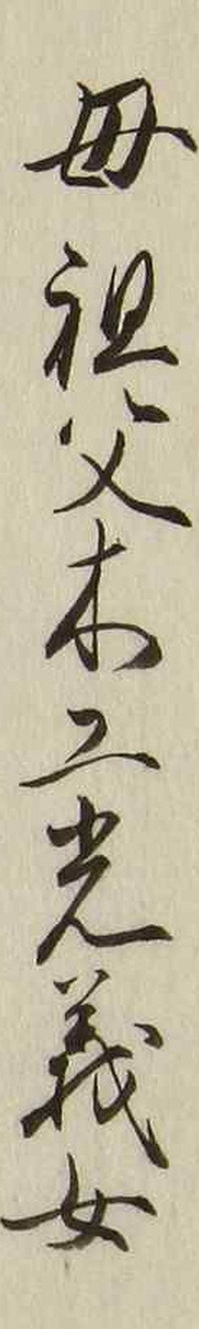母祖父木工光義女
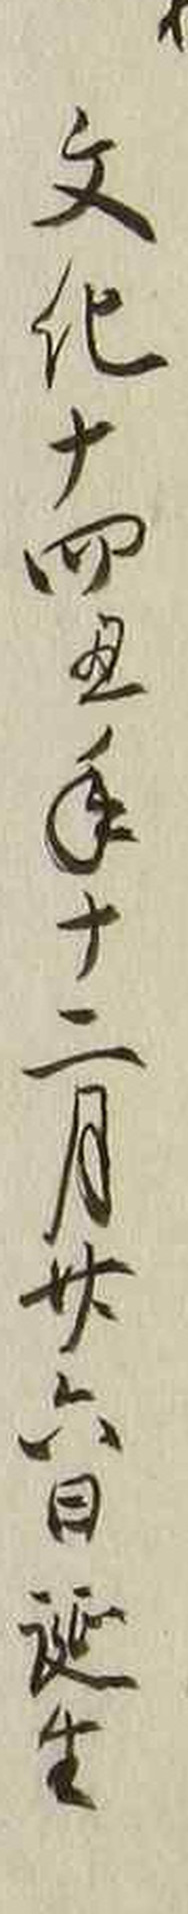文化十四丑年十二月廿六日誕生
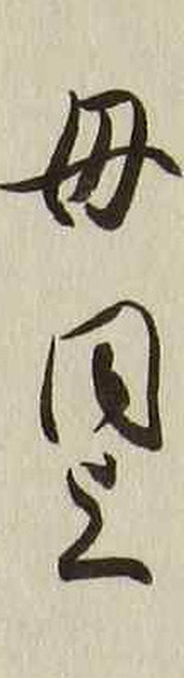母同上
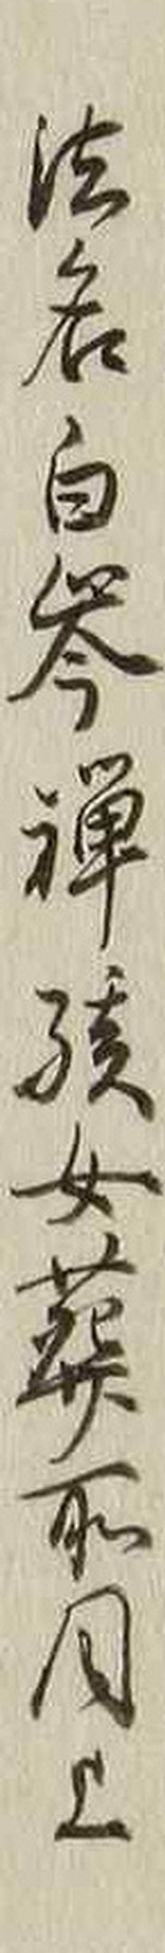法名白峯禅駭女葬所同上
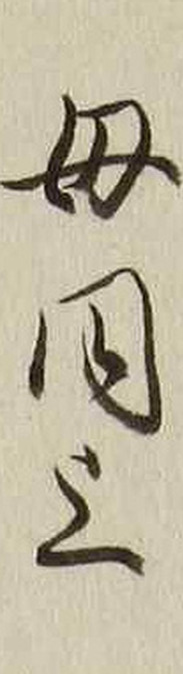母同上
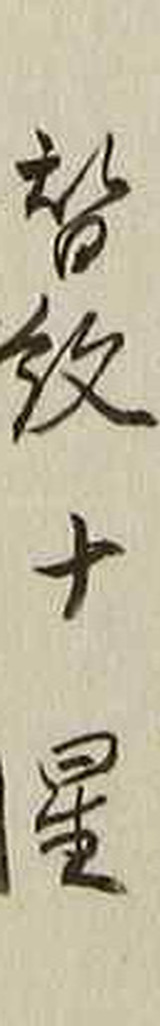替紋十星
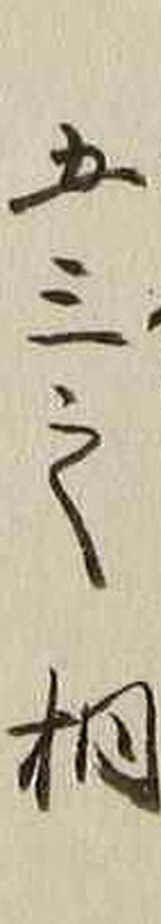五三之桐
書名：諸士系譜　巻之21　い之部21
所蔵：会津若松市立会津図書館
